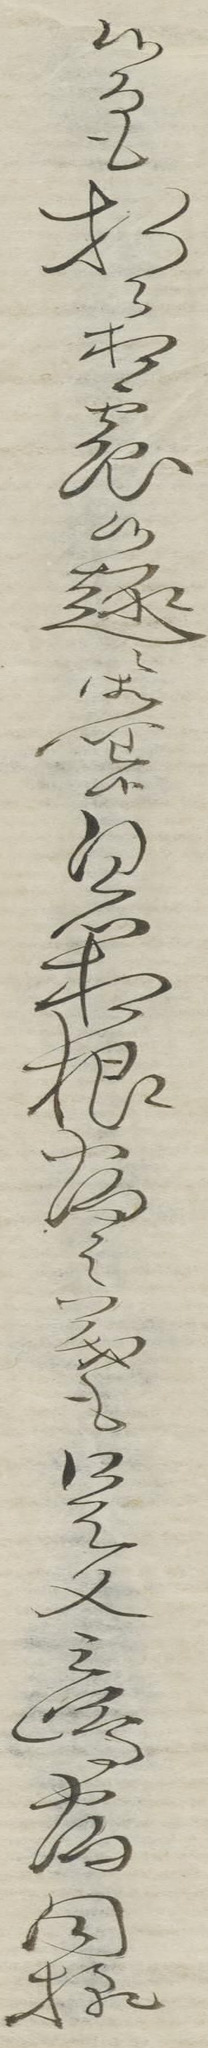候而も折々相震候趣ニ御座候且箱根宿之義も是又三嶋宿同様
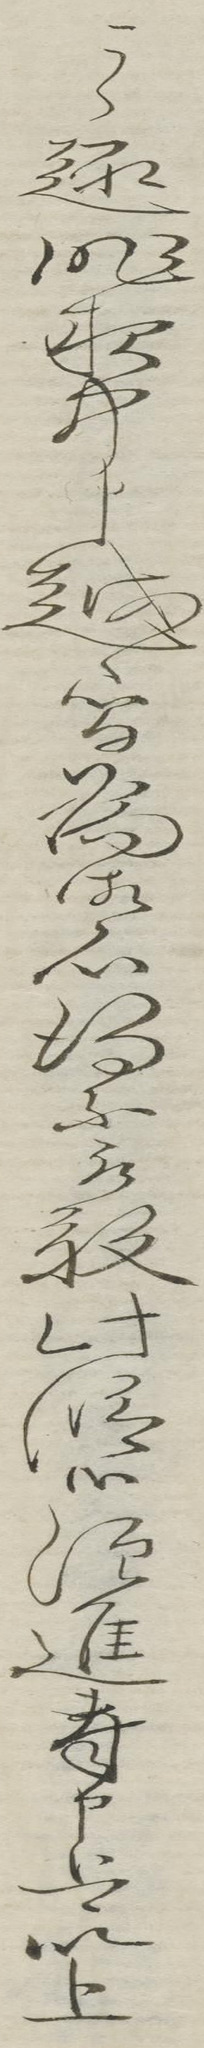之趣昨夜中申越候間為御心得不取敢此段御注進奉申上候以上
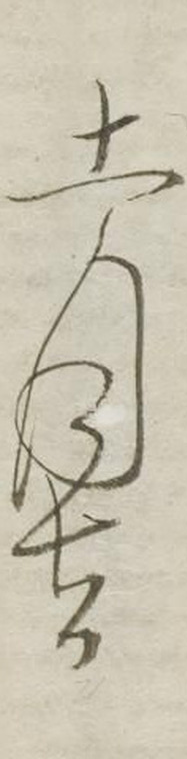十一月七日
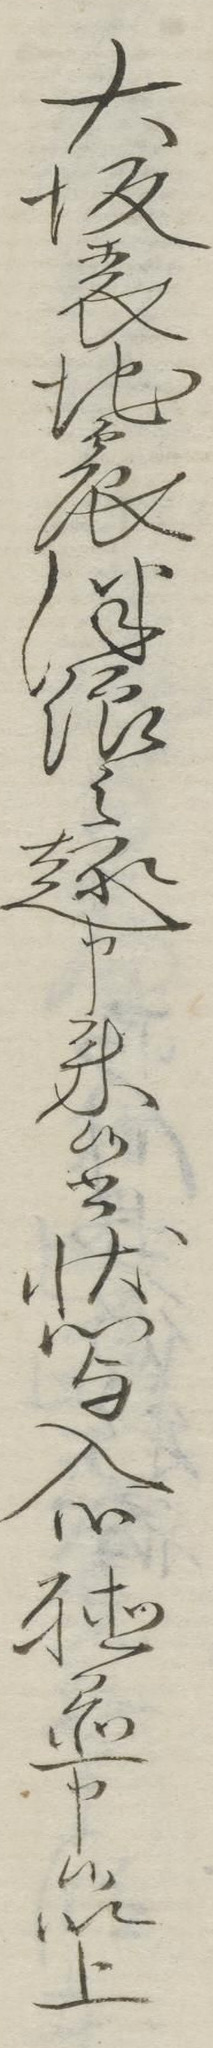大坂表地震津浪之趣申来候書状写入御聴置申候以上
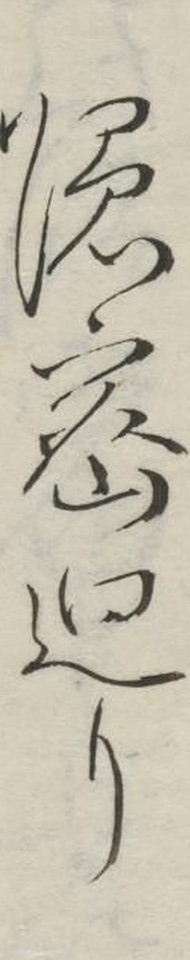隠密廻り
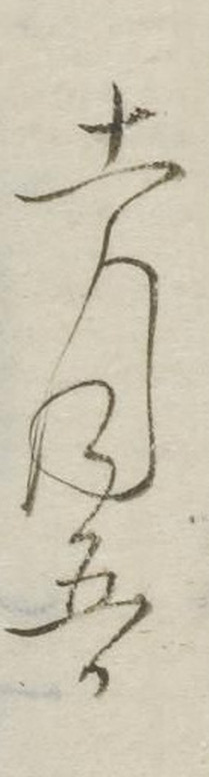十一月七日
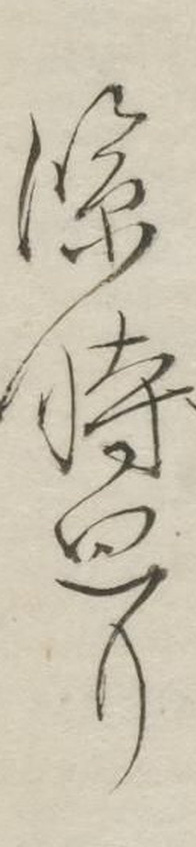臨時廻り
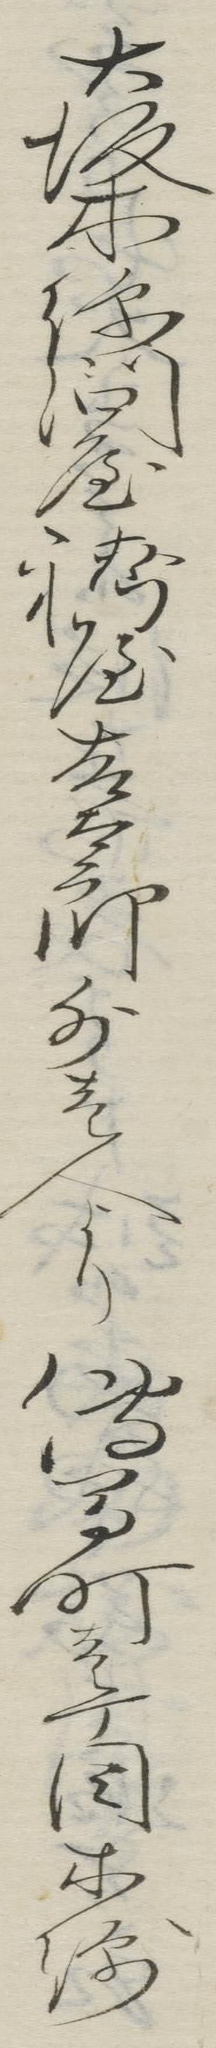大坂木綿問屋袴屋吉太郎外壱人より伝馬町壱丁目木綿
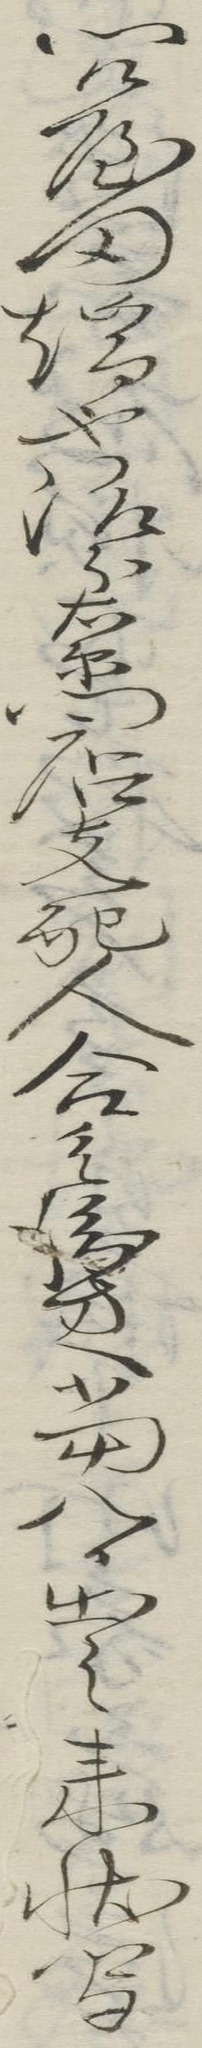問屋田端や治郎右衛門店支配人合兵衛方へ当八日出之来状写
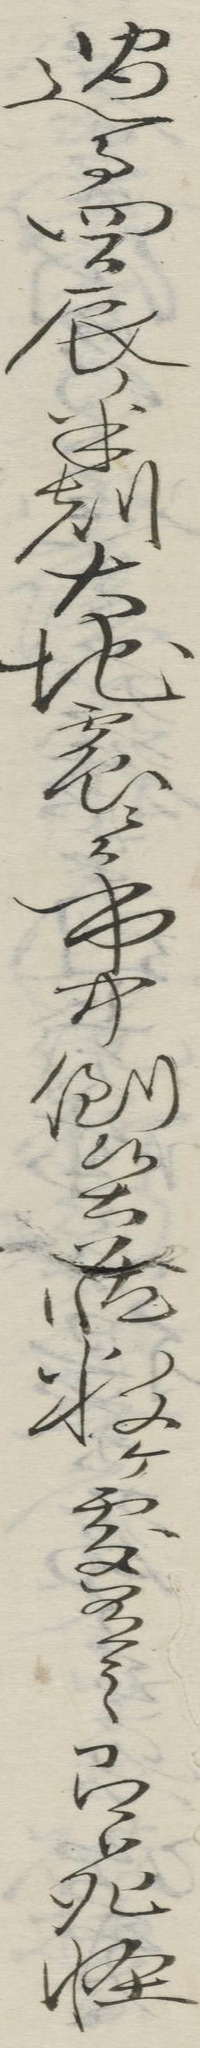過る四日辰ノ半刻大地震ニ而市中倒候土蔵数ケ所有之即死怪
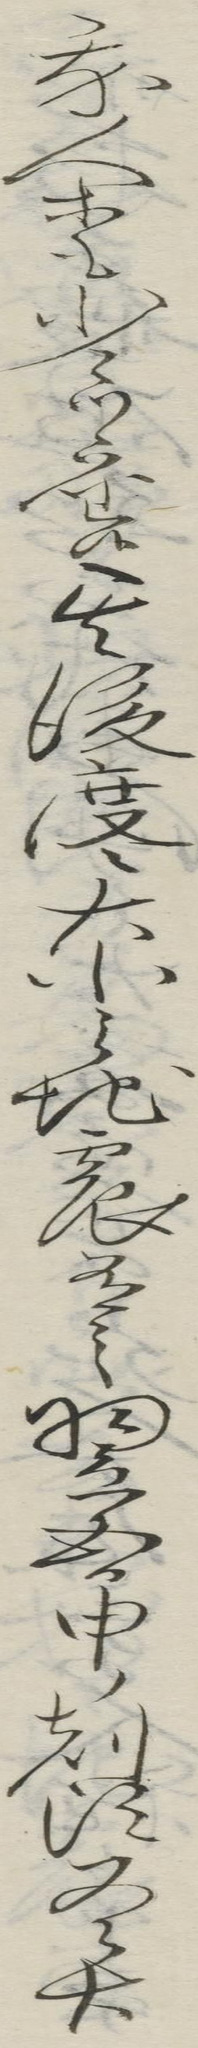我人等も少々御座候其後度々大小之地震有之翌五日申ノ刻頃又々大
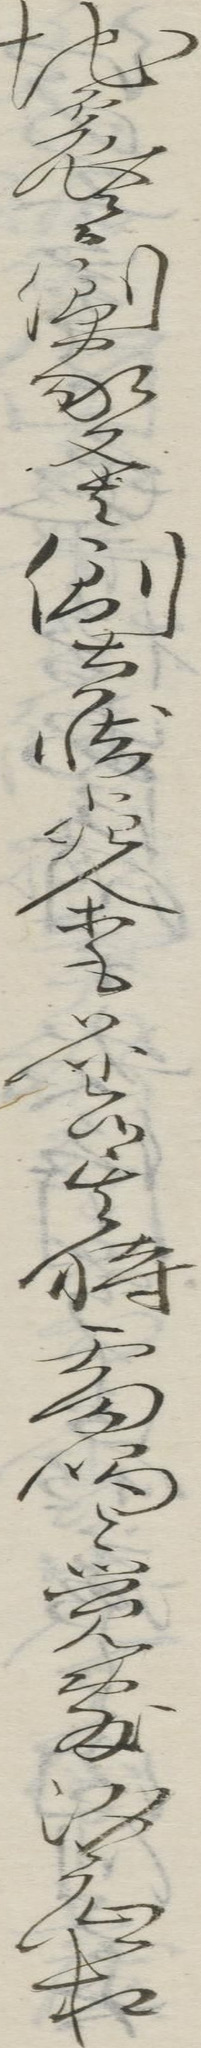地震ニ而倒家又は倒土蔵死人等も御座候其時雷鳴と覚敷汐底相
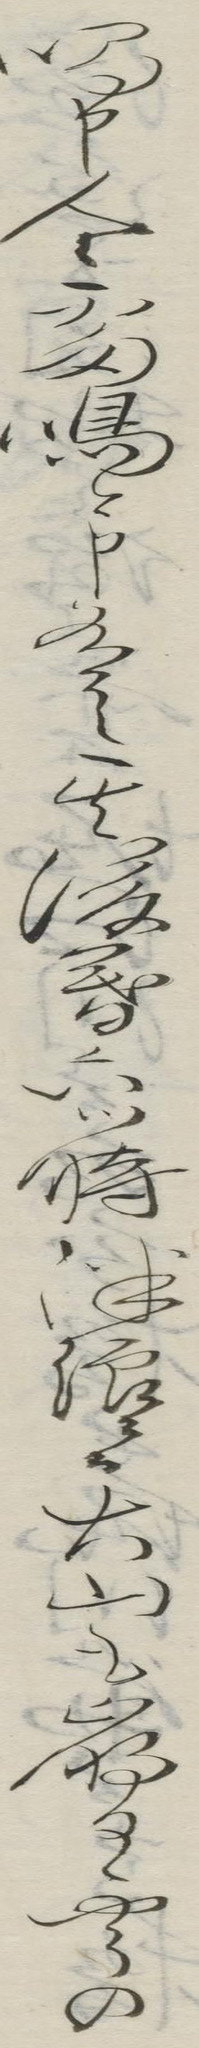鳴申人々雷鳴と申有之其後暮六ッ時津浪ニ而大山も崩るゝやうの
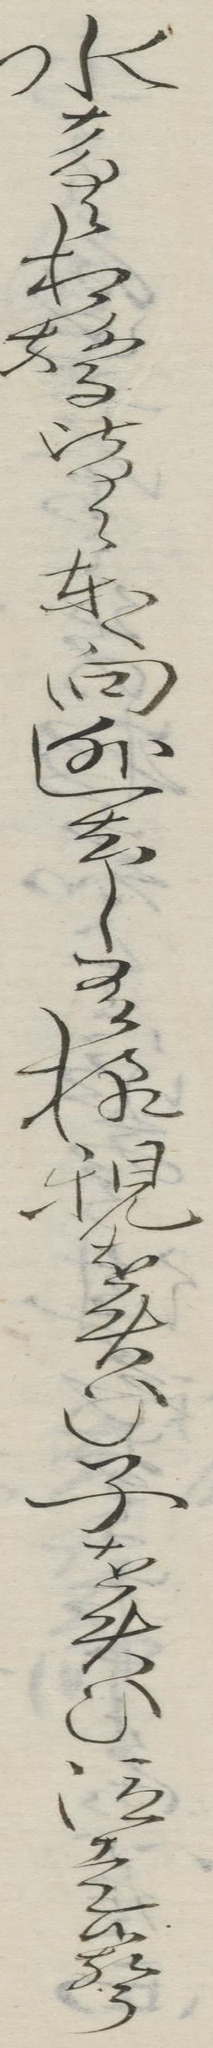水音ニ相驚き皆々東へ向逃去し有様親を失ひ子を失ひ泣走候声
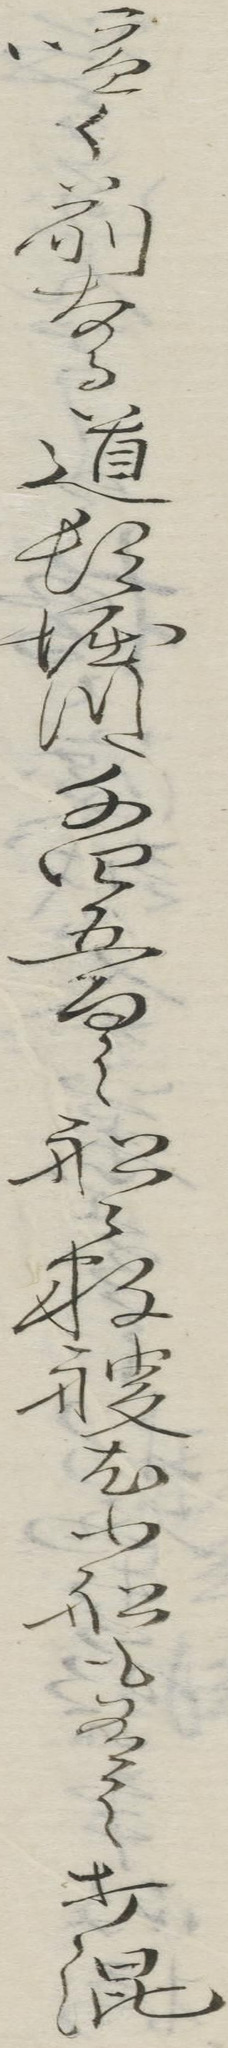喧く前なる道頓堀川へ千四五百之船ニ数艘尤小船も有之打混
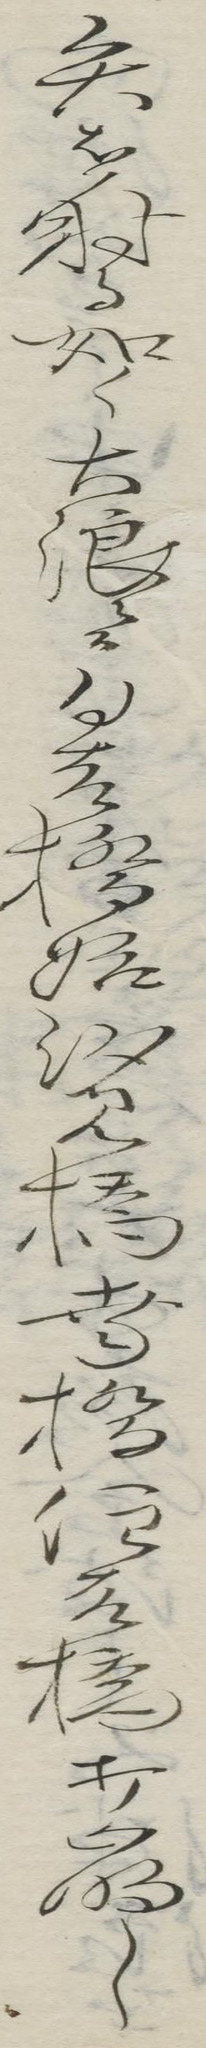矢を射る如く大浪ニ而日吉橋始汐見橋幸橋住吉橋打崩し
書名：大地震實録
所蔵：東京大学地震研究所図書室 Earthquake Research Institute Library, The University of Tokyo, JAPAN
